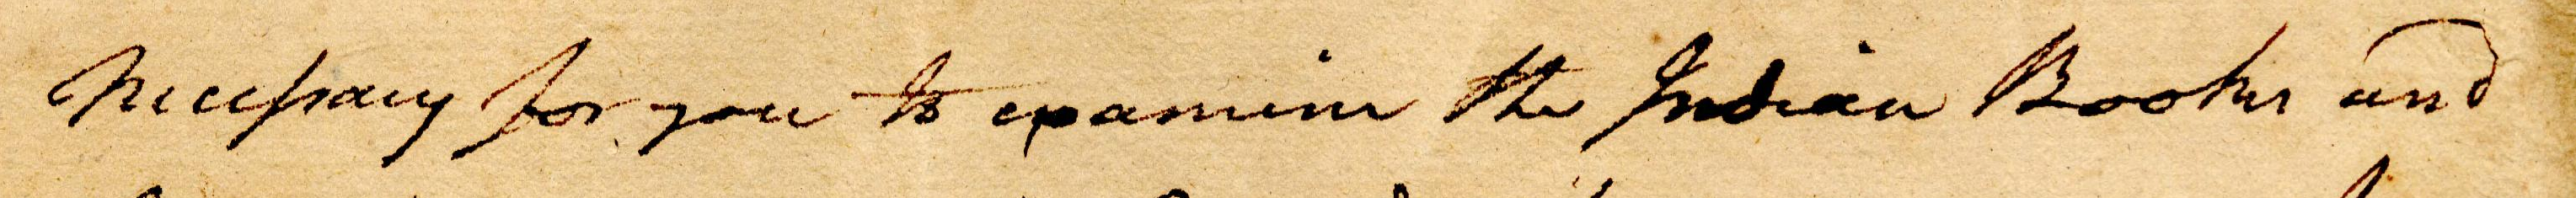necessary for you to examine the Indiana Books and
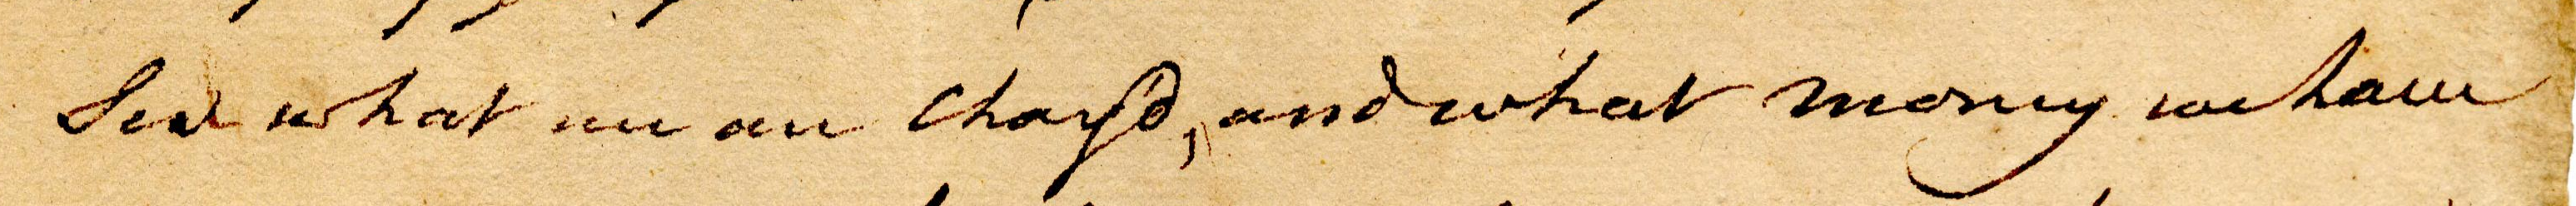See what we are charg'd, and what money we have
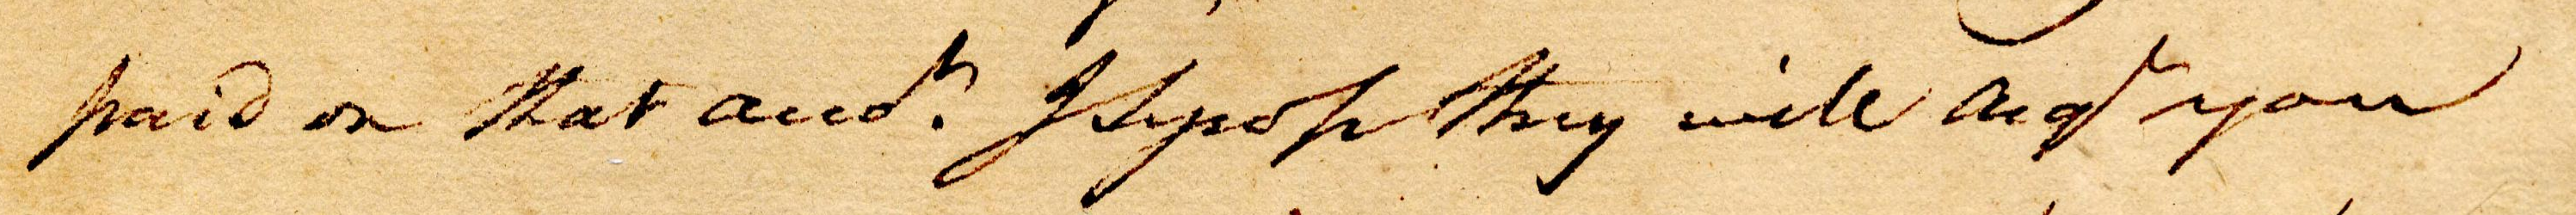paid on that acco^t. I supos they will Acq^t you
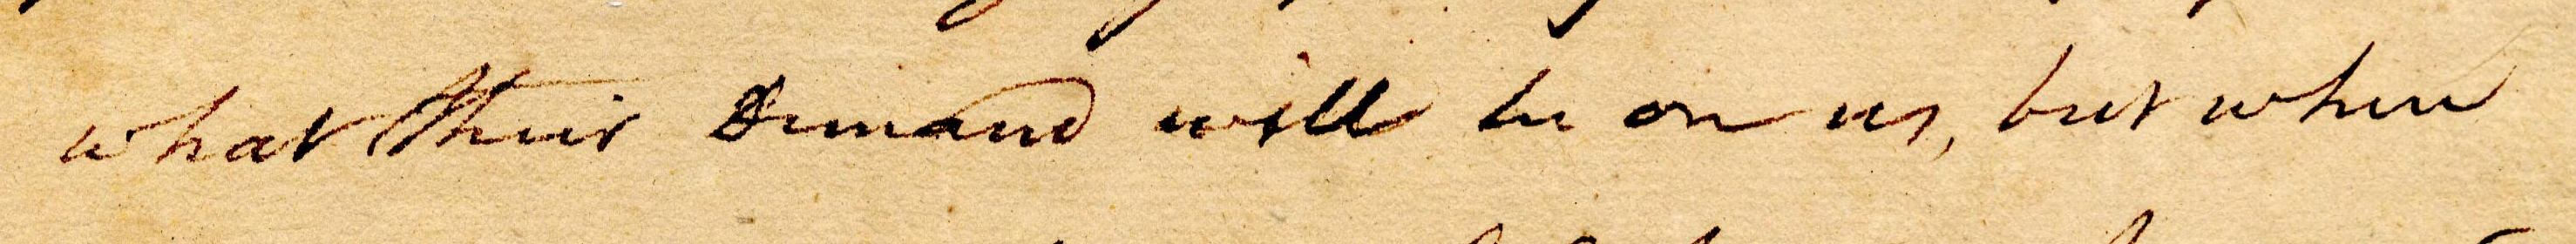what their Demand will be on us, but whene
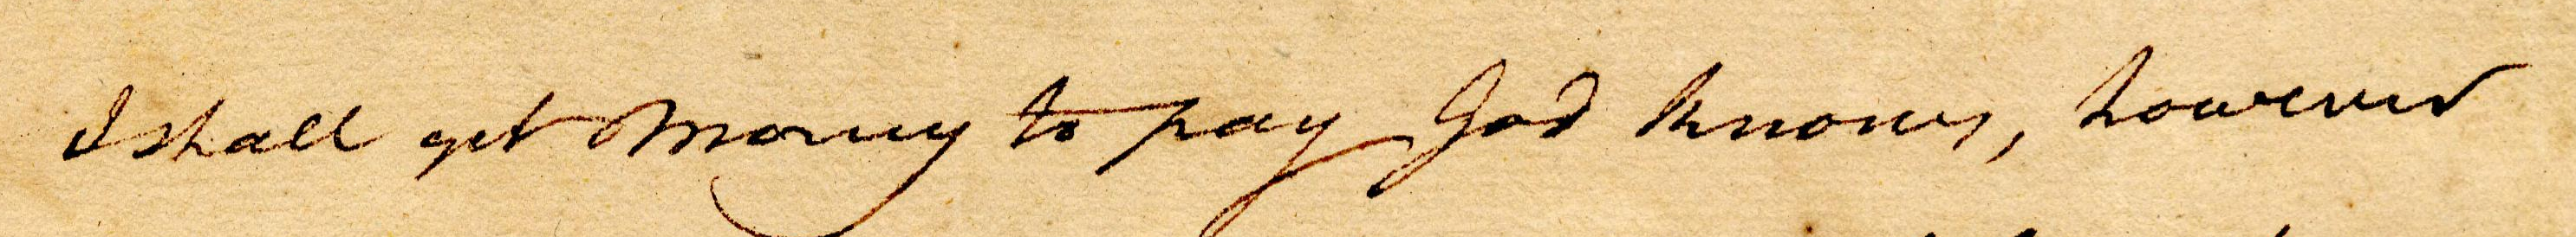I shall get money to pay God knows, however
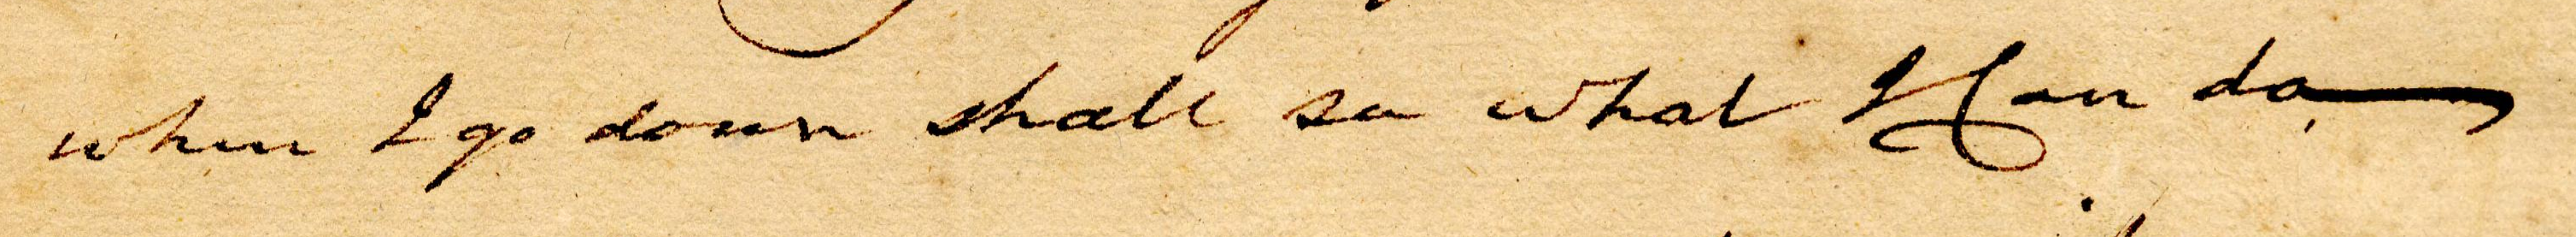when I go down shall see what I Can do,
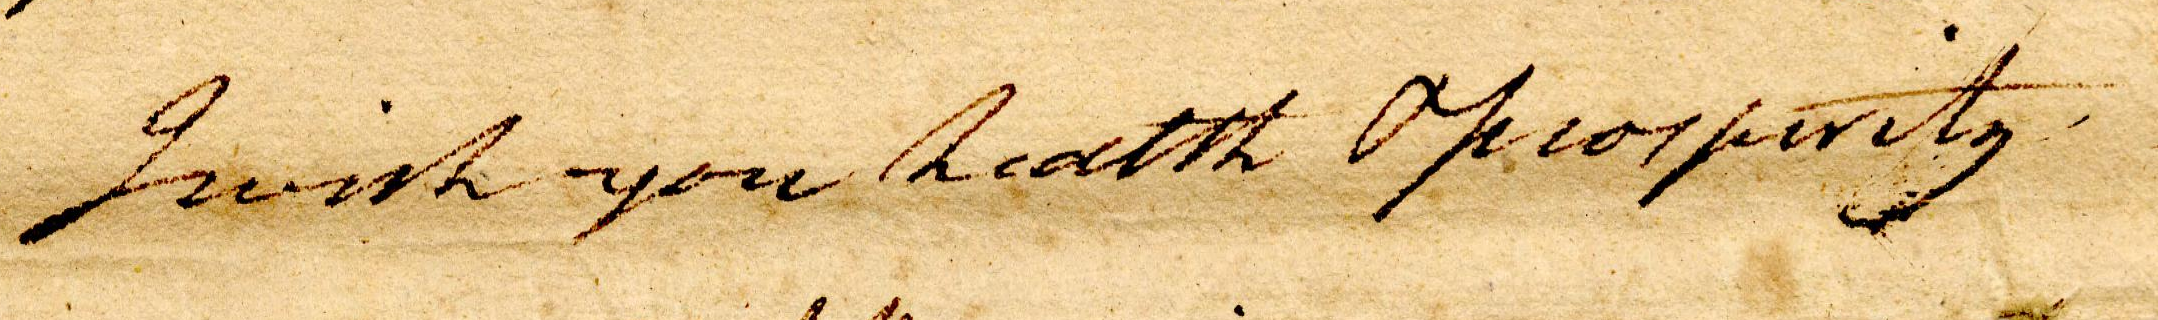I wish you health & prosperity
